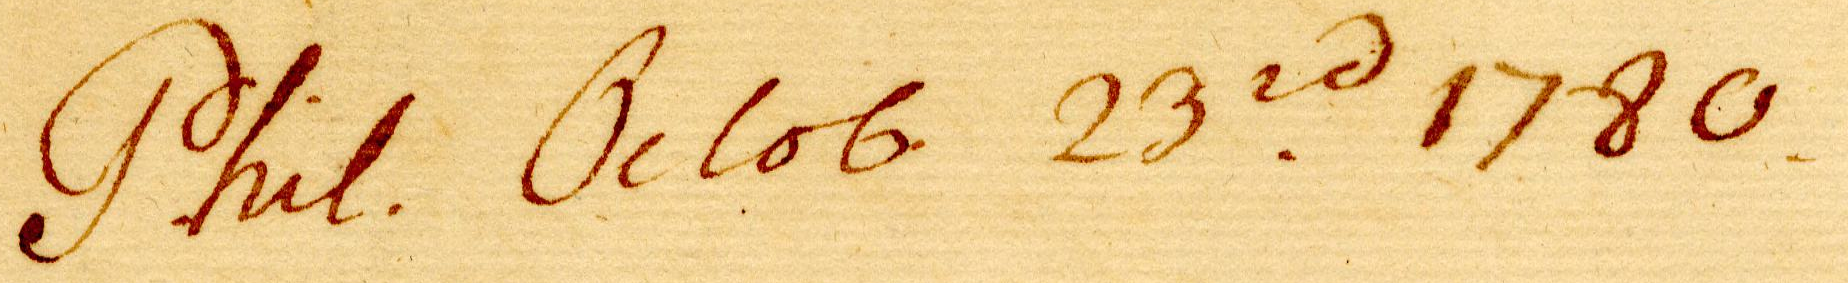Phil. Octob. 23^rd. 1780
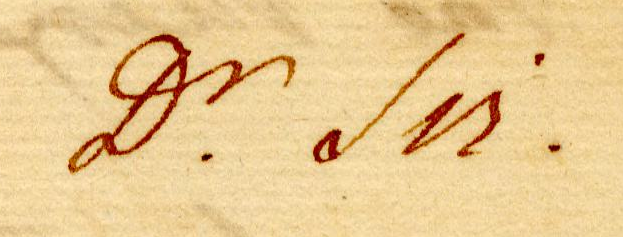D^r. Sir.
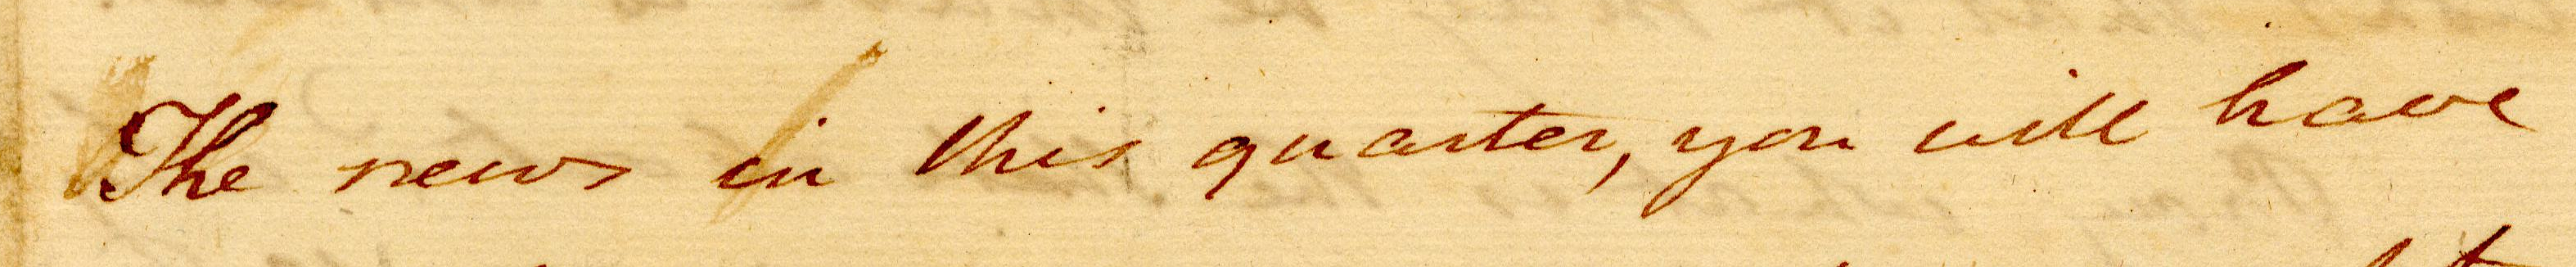The news in this quarter, you will have
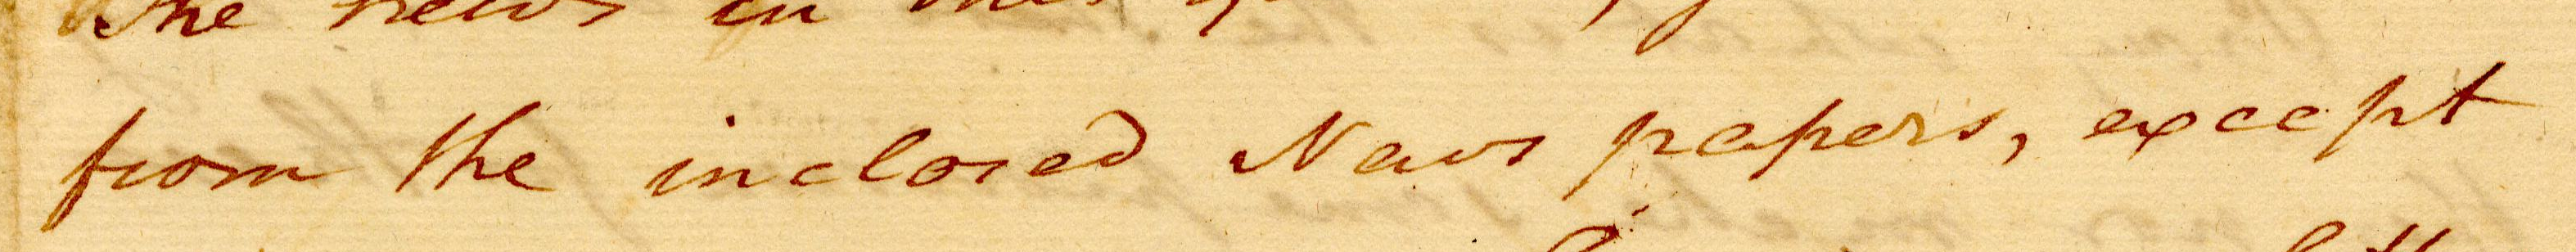from the inclosed Newspapers, except
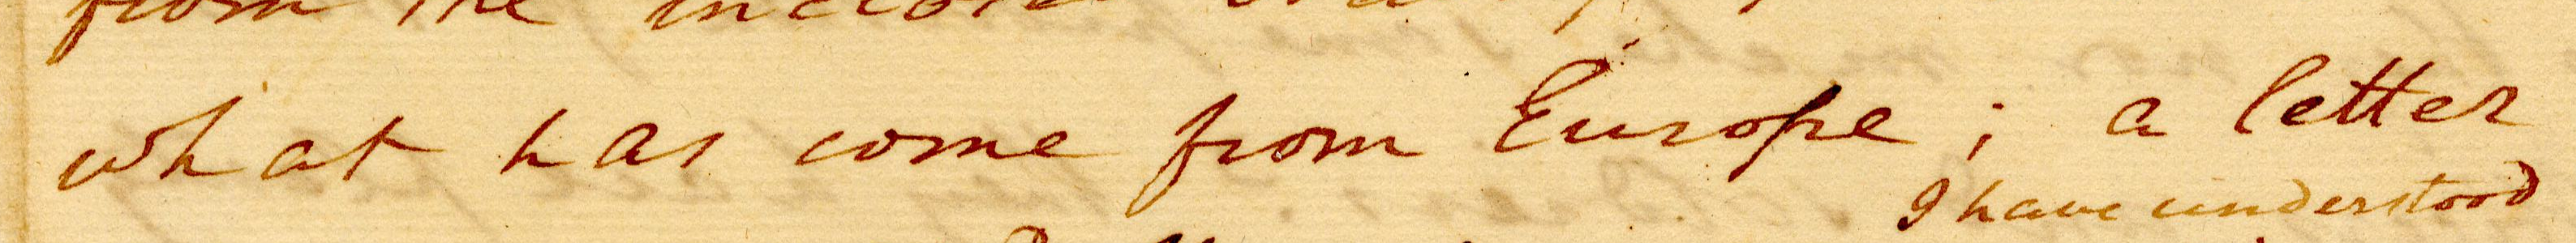what has come from Europe; a letter
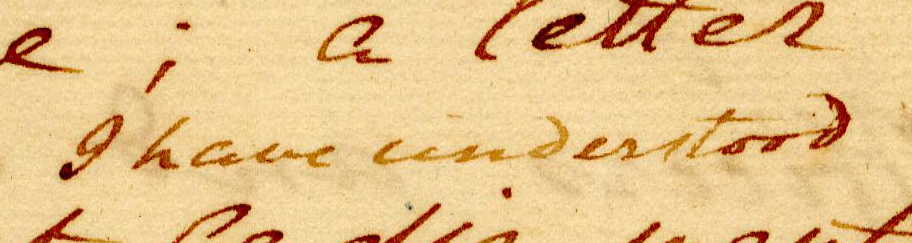I have understood
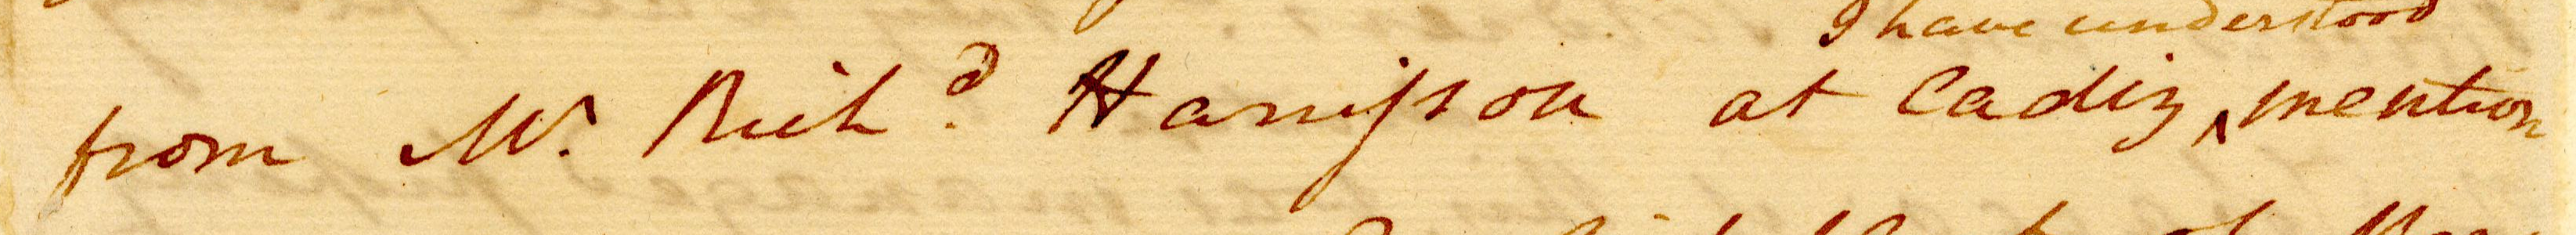frin M^r. Rich^d Harrison at Cadiz ^ mention
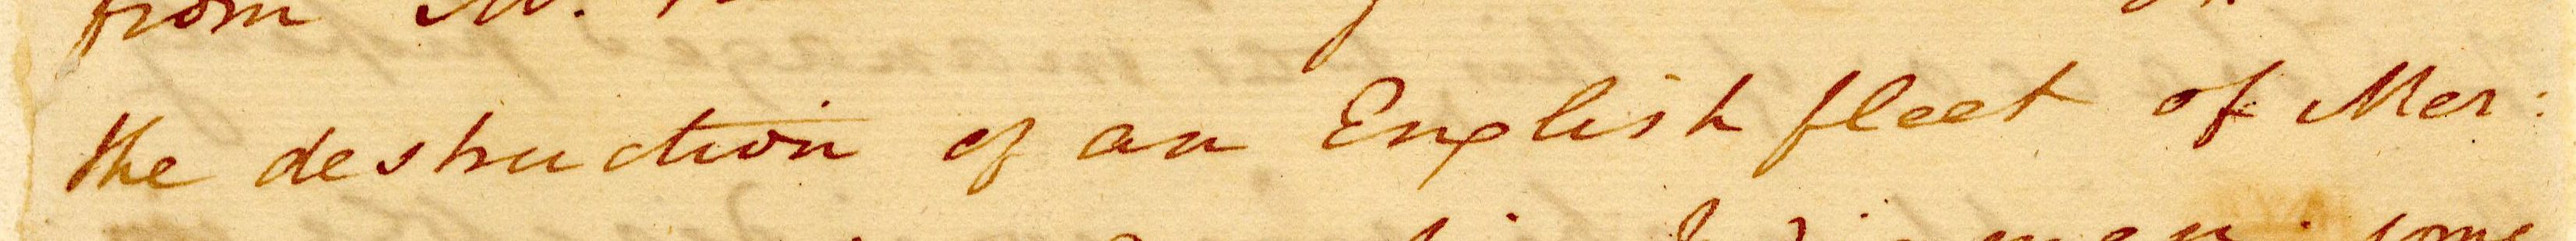the destruction of an English fleet of Mer-
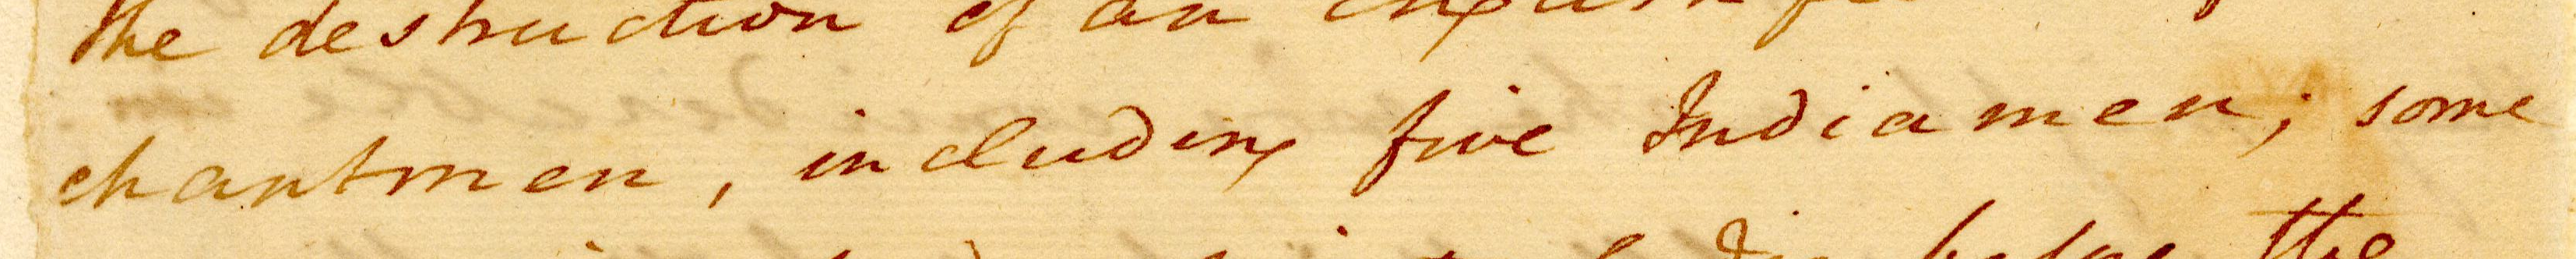chantment, including five Indiamen; some
